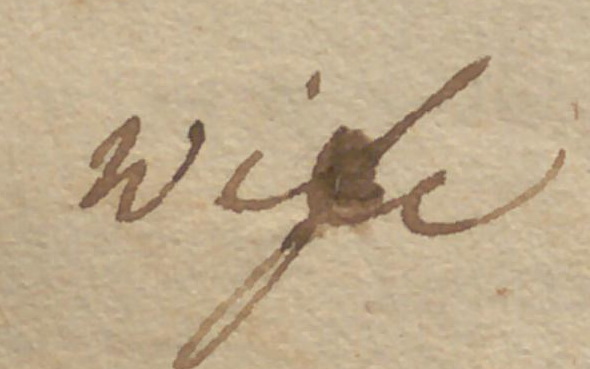wife
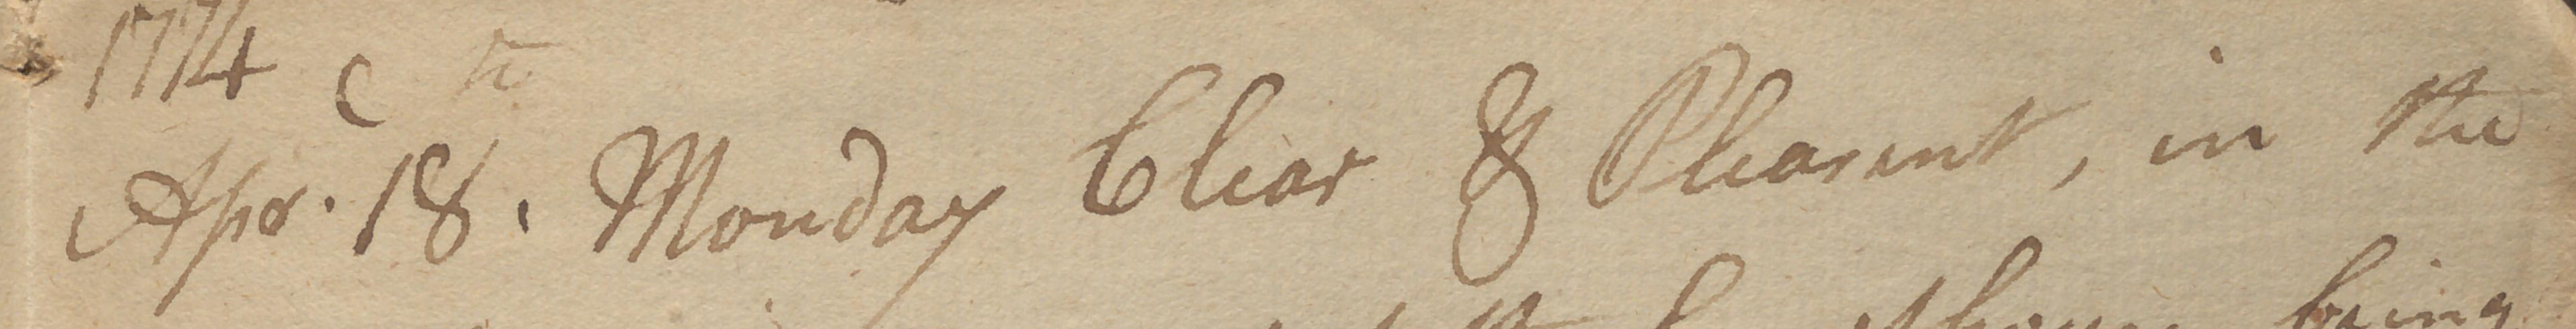Apr^l. 18. Monday Clear & Pleasent, in the
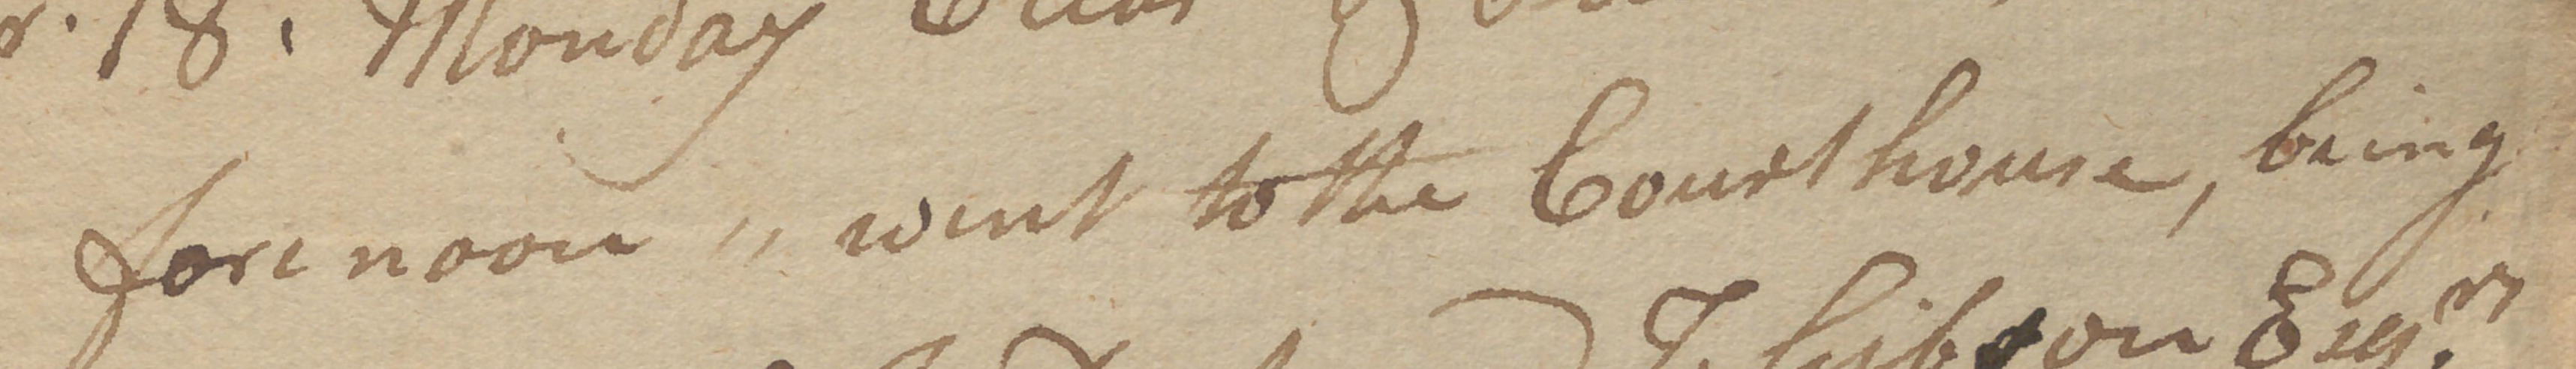forenoon, went to the Courthouse, being
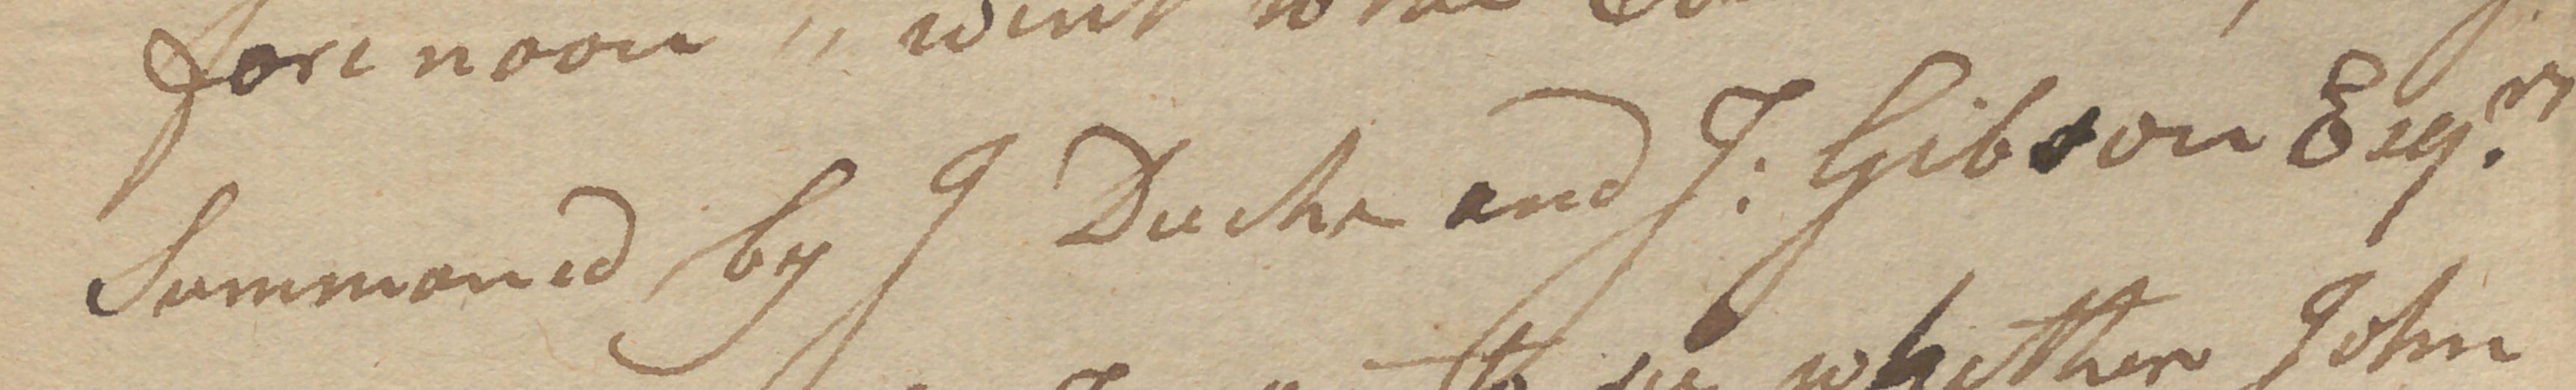Summoned by I Duche and J: Gibson Esq^r.
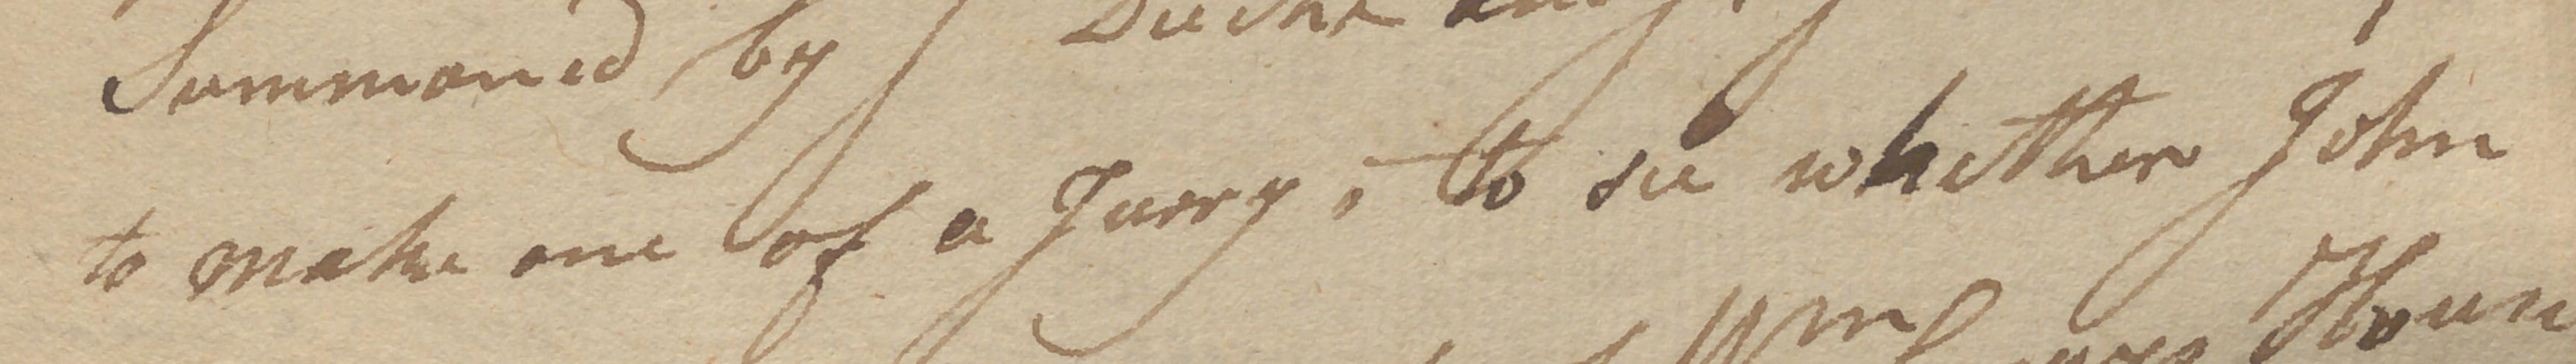to make one of a Jurry, to see whether John
